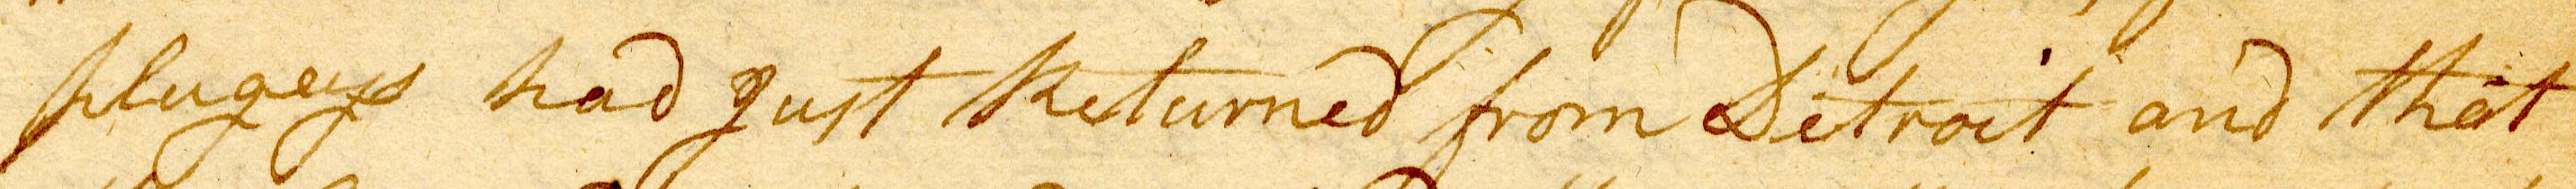plugeys had just Returned from Detroit and that
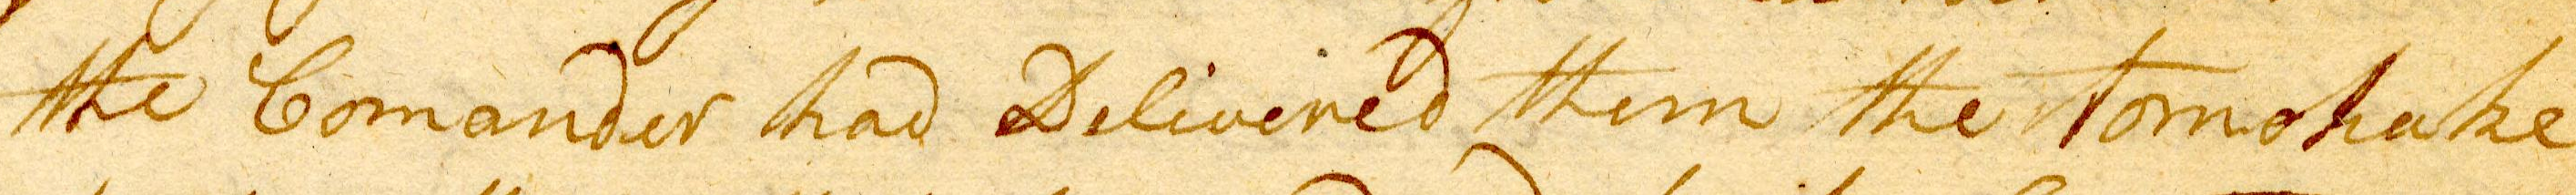the Comander had Delivered them the tomohake
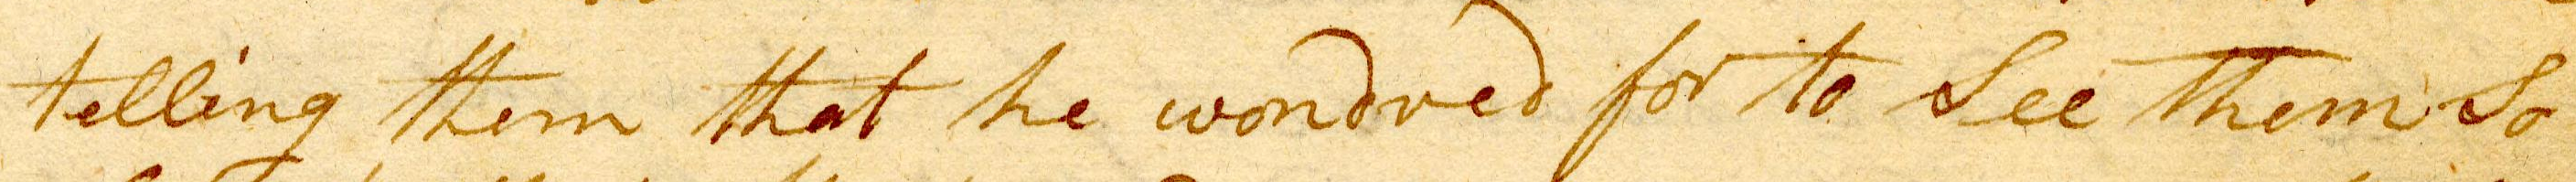telling them that he wondred for to see them so
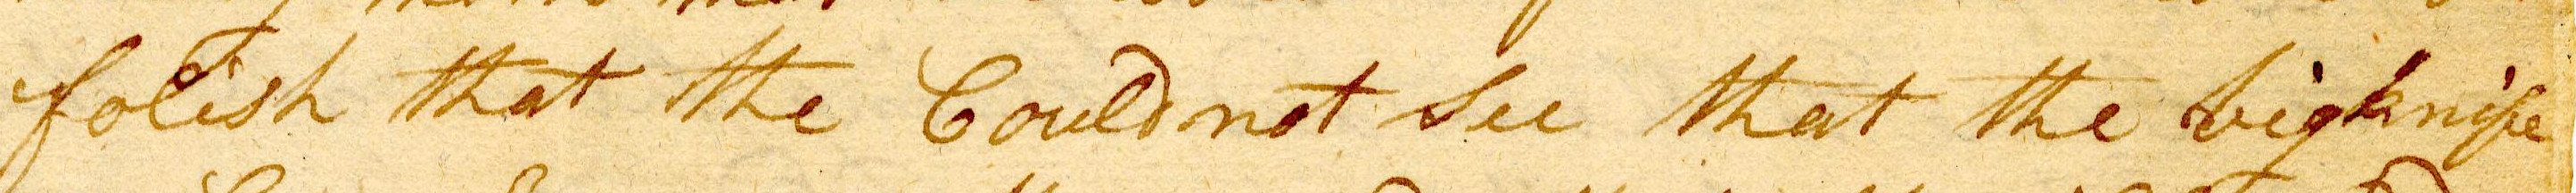folish that the Could not see that the big knife
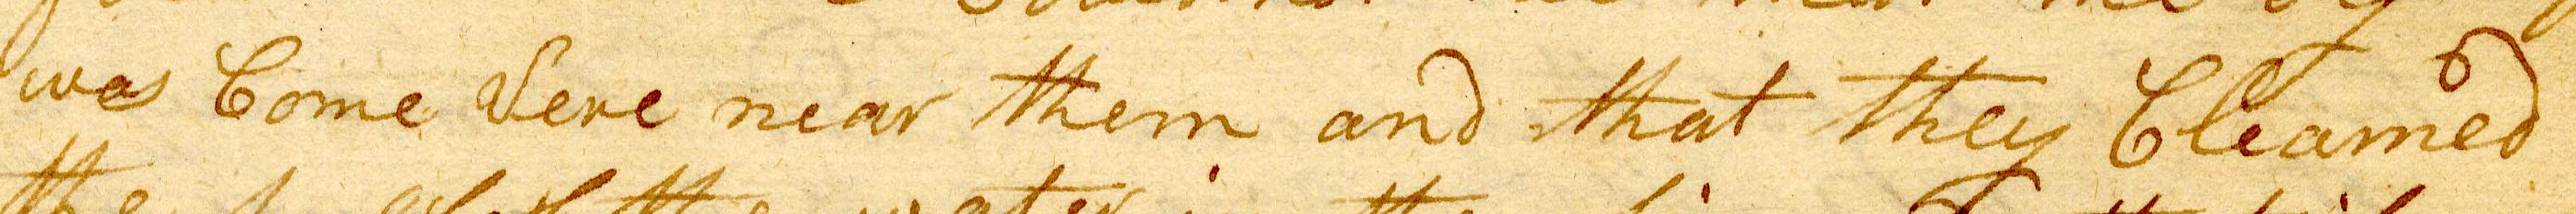was Come Vere near them and that they Cleamed
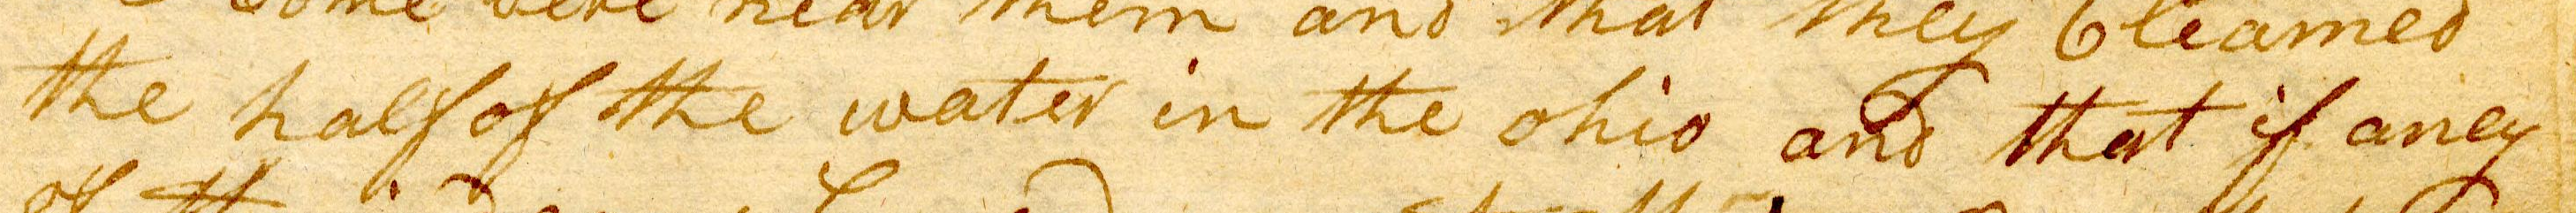the half of the water in the ohio and that if aney
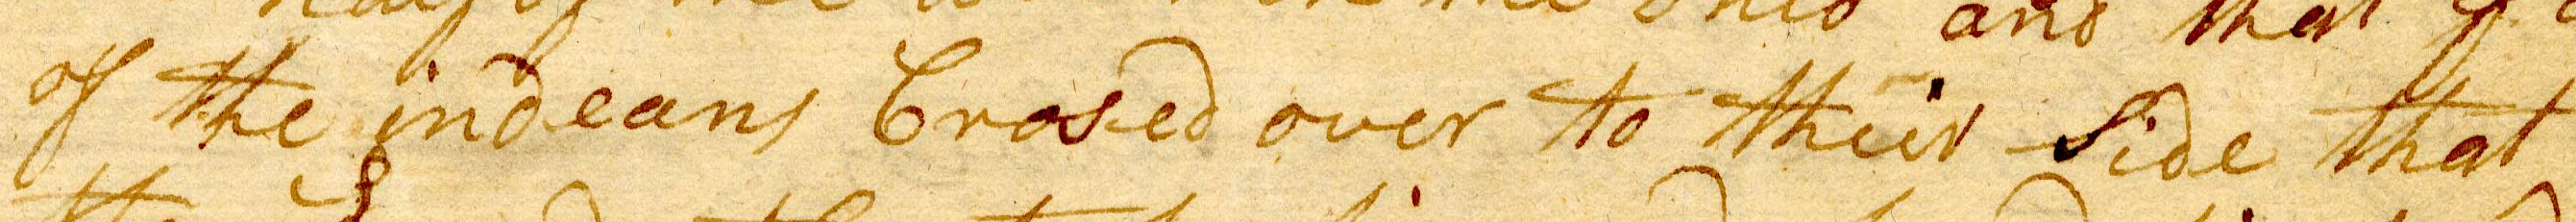of the indeans Crosed over to their side that
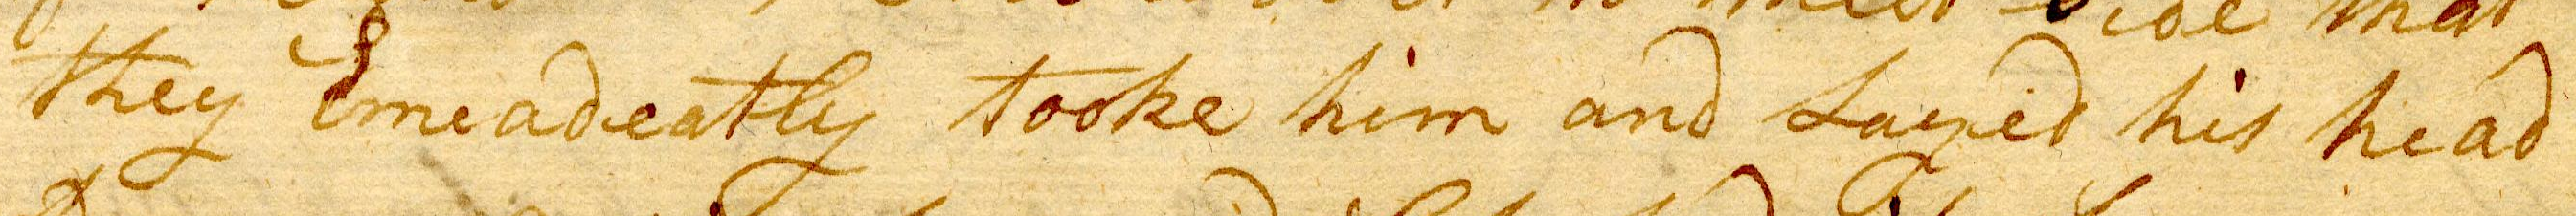they Emeadeatly tooke him and Layed his head
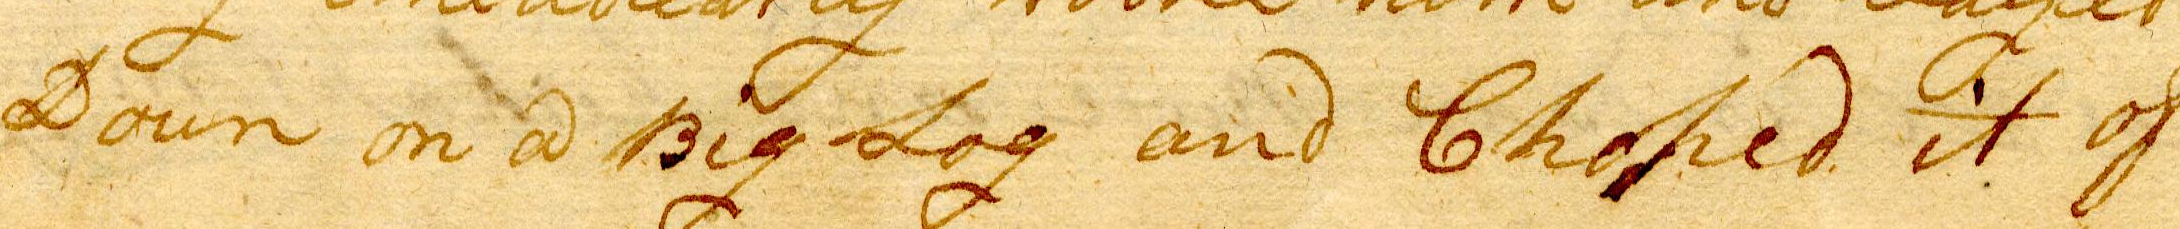Down on a Big Log and Choped it of
